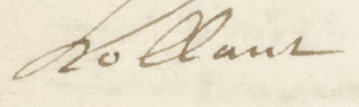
Hollant
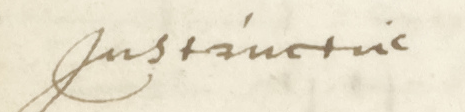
Instructie
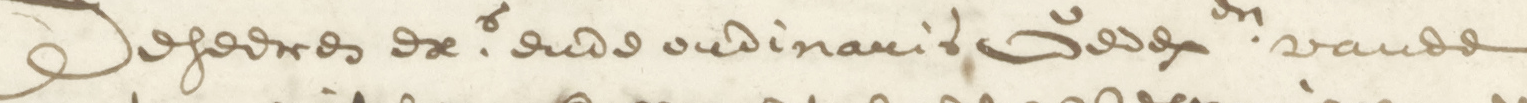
De heeren exs. ende ordinaris Gedepen. vande
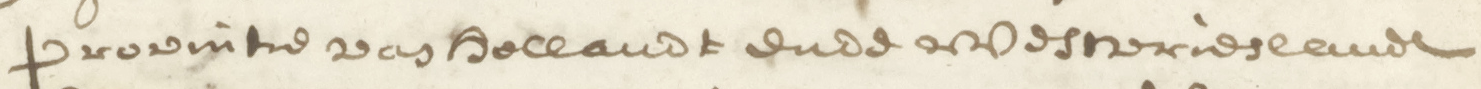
provintie van Hollandt ende Westvrieslandt
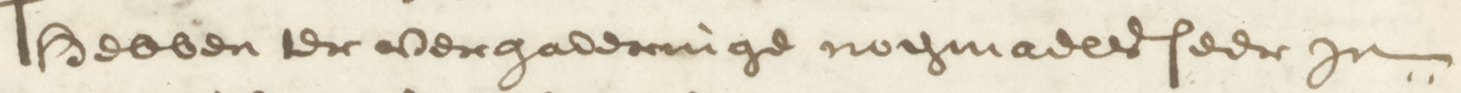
hebben ter Vergaderinge nochmaels seer In„
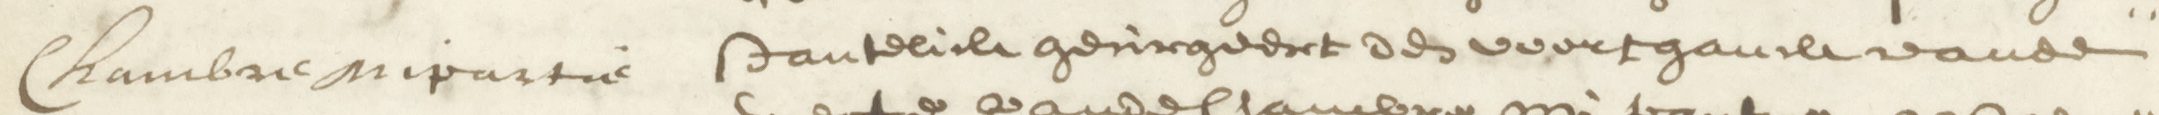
stantelick geurgeert den voortganck vande
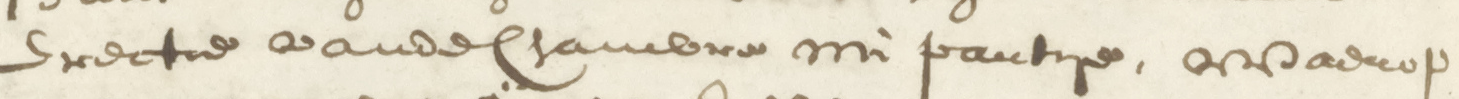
erectie vande Chambre Mi partye. Waerop
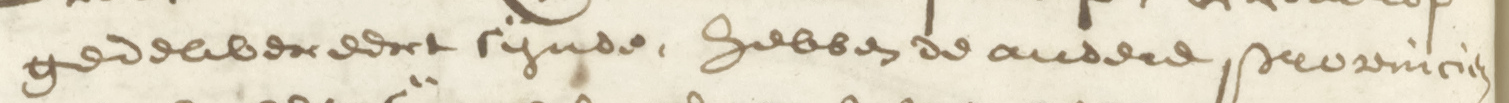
gedelibereert sijnde, hebben de andere Provincien
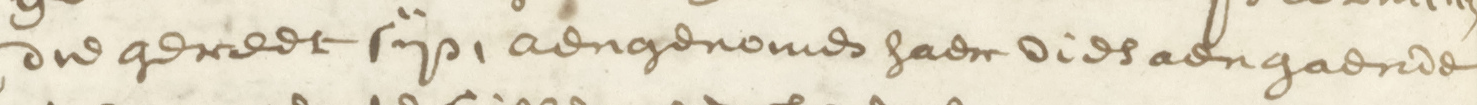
die gereet sijn, aengenomen haer dies aengaende
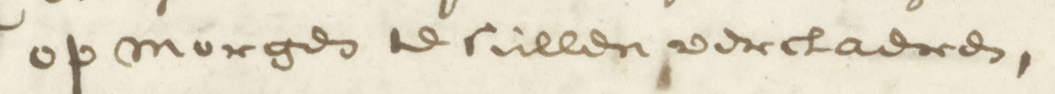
op morgen te sullen verclaeren.
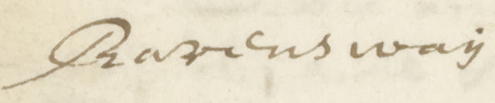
Ravenswaij.
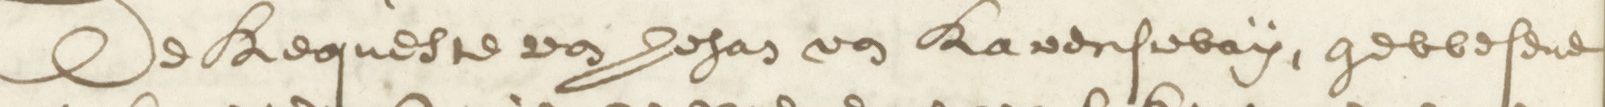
De Requeste van Johan van Ravenswaij, gewesene
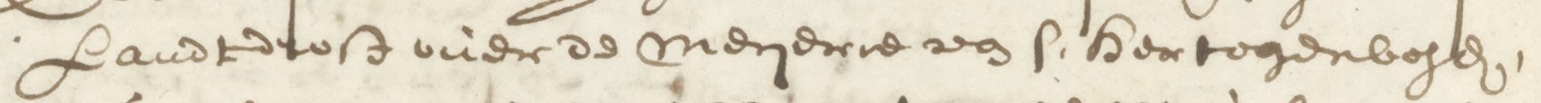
Landtdrost over de meyerie van s‛ Hertogenbosch,
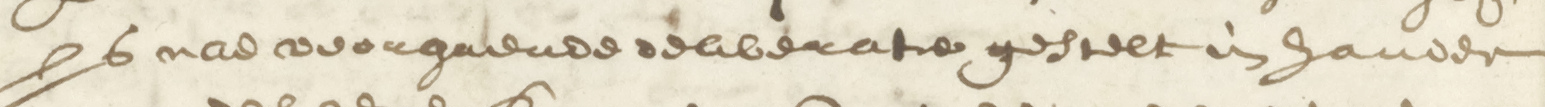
Is nae voorgaende deliberatie gestelt in handen
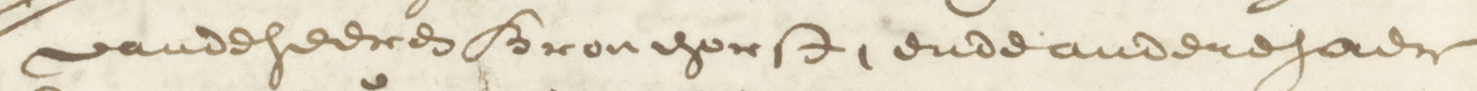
vande heeren Bronchorst, ende andere haer
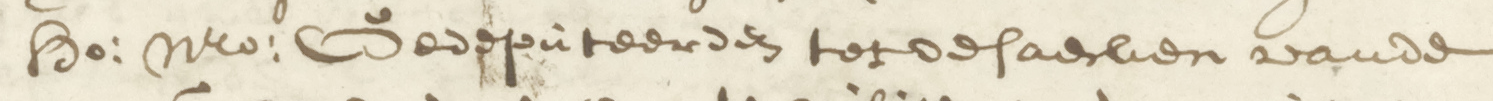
Ho:Mo: Gedeputeerden tot de saecken vande
